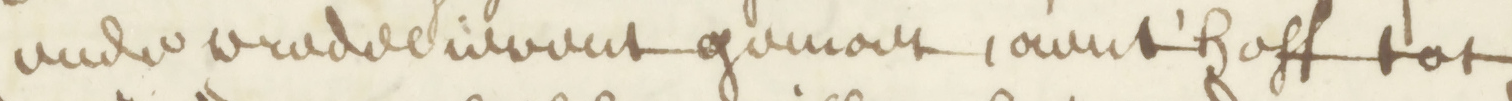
ende vredelievent gemoet, aent‛ hoff tot
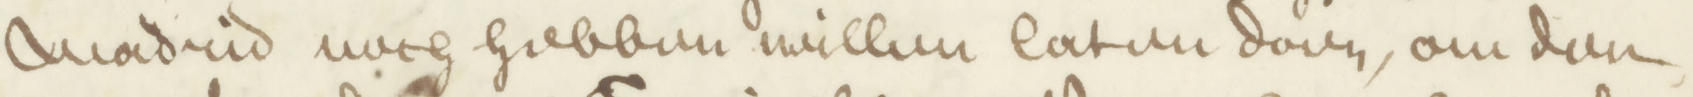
madrid noch hebben willen laten doen, om den
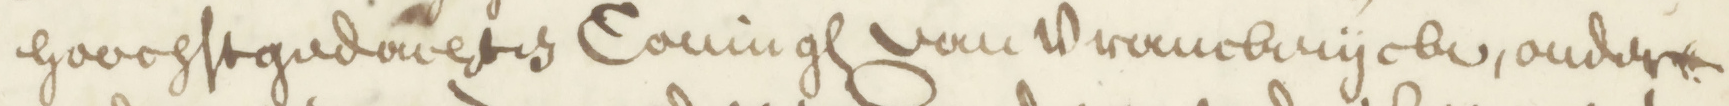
hoochstgedachten Coningh van Vranckrijck, onder
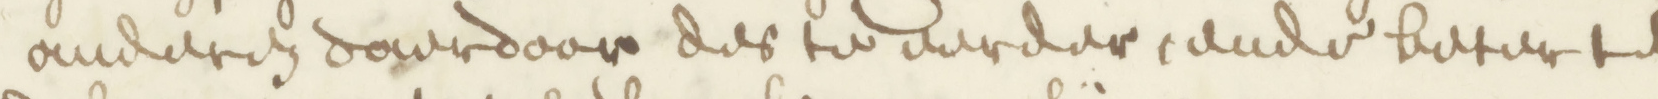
anderen daerdoor des te eerder, ende beter te
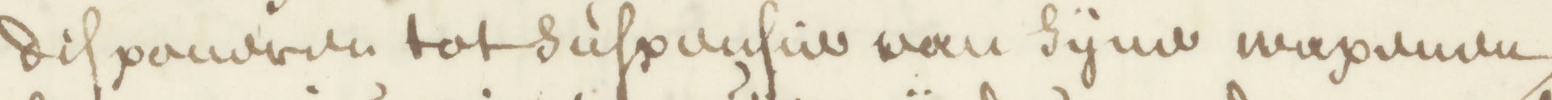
disponeren tot suspensie van sijne wapenen
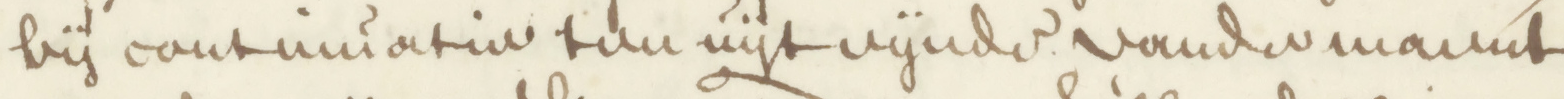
bij continuatie ten uijt eijnde vande maent
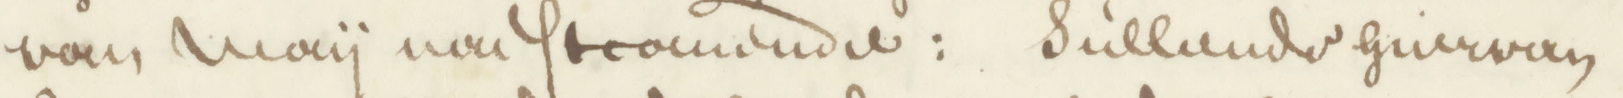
van Maij naestcomende: Sullende hiervan
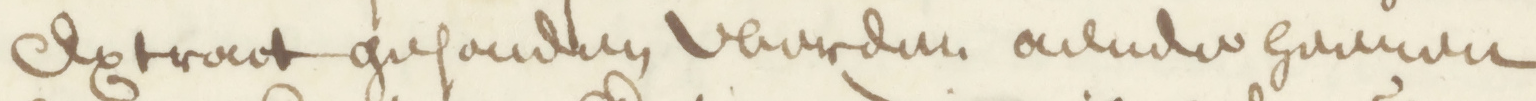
Extract gesonden werden aende heeren
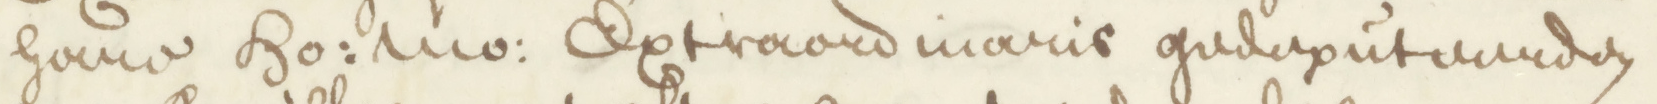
hare Ho:Mo: Extraordinaris gedeputeerden
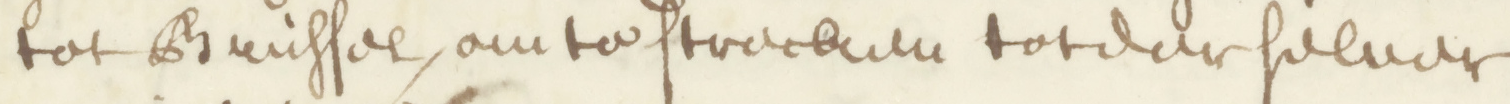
tot Brussel, om te strecken tot derselver
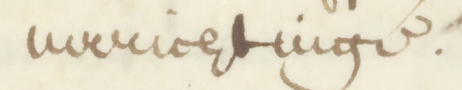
narichtinge.
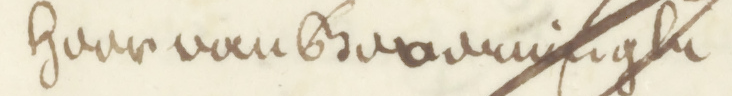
heer van Beverningk
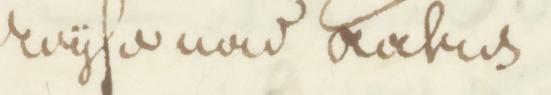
reijse nae Aaken
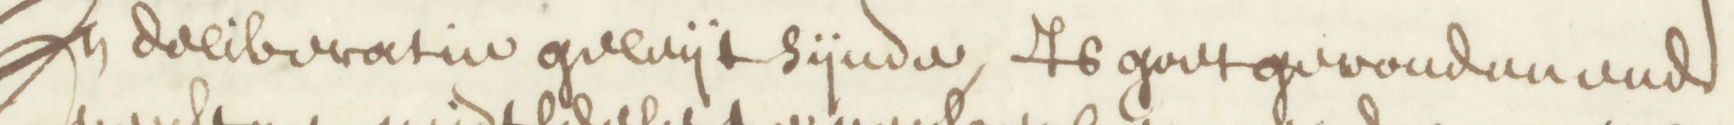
In deliberatie geleijt sijnde, Is goetgevonden ende
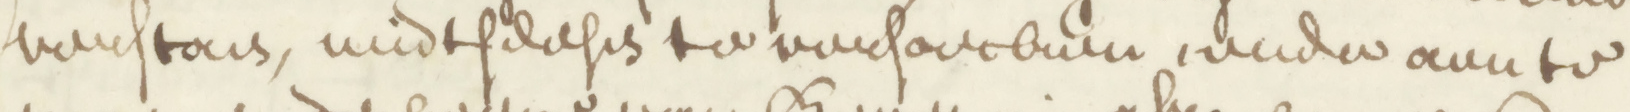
verstaen, midtsdesen te versoecken, ende aen te
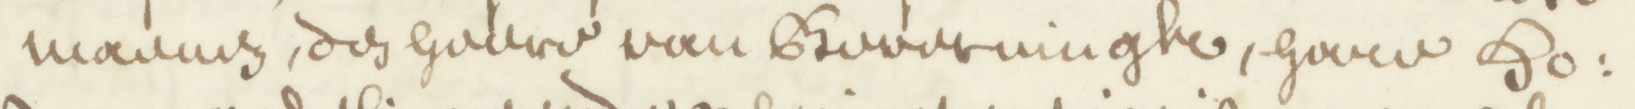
maenen, den heere van Beverningk, hare Ho:
